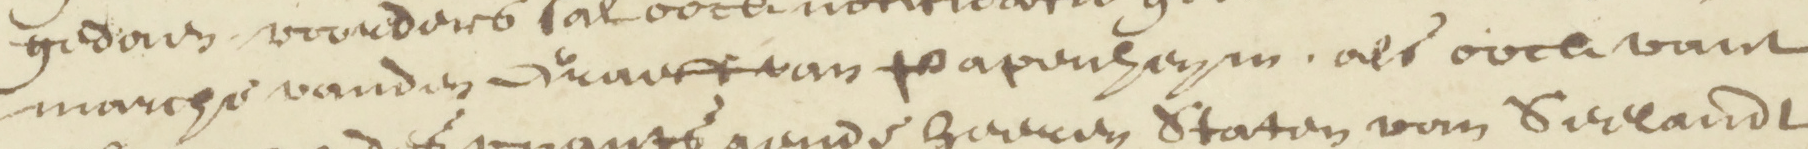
marche vanden Graeff van Papenheym, als oock vant
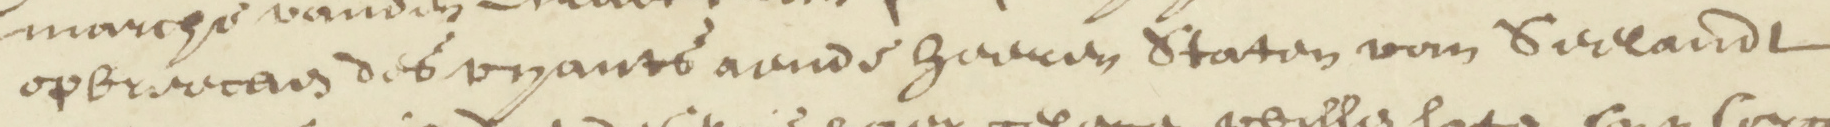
opbreecken des vyants aende heeren Staten van Seelandt
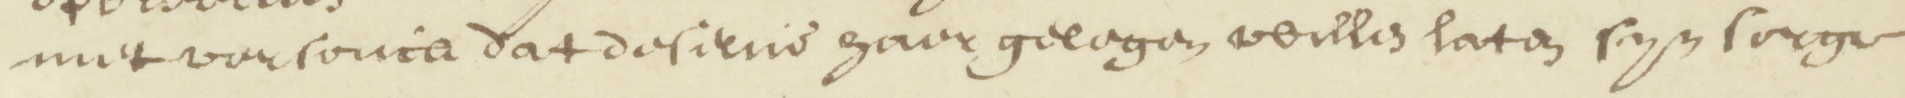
met versouck dat deselue haer gelegen willen laten syn sorge
